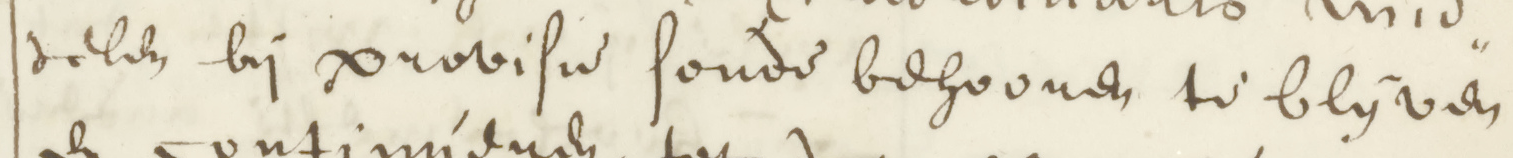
delen bij provisie soude behooren te blijven
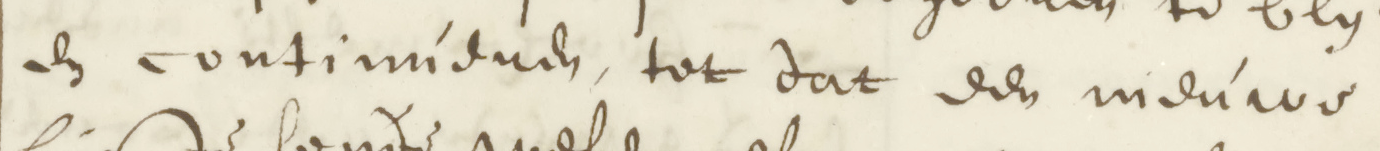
en continueren, tot dat een nieuwe
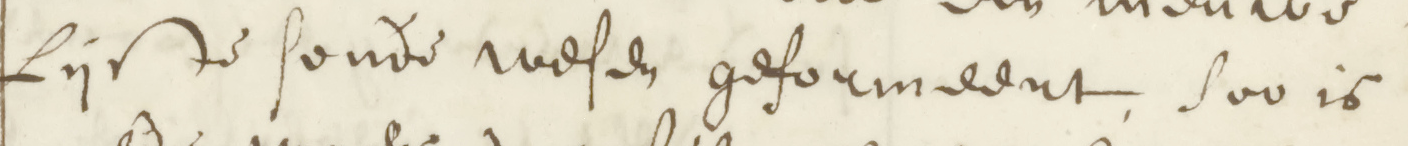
Lijste soude wesen geformeert, soo is
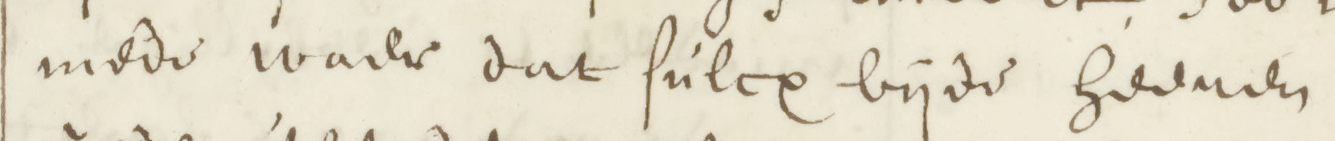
mede waer dat sulcx bijde heeren
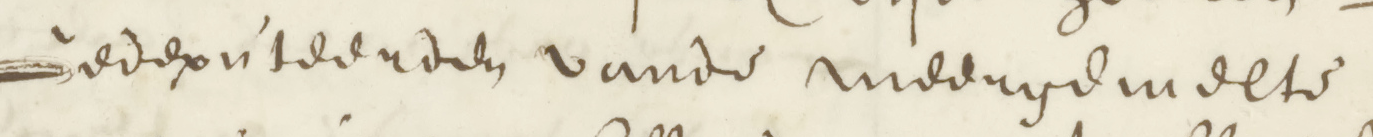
Gedeputeerden vande meergemelte
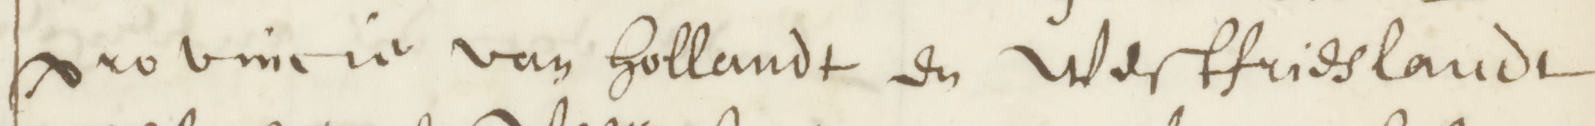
provincie van Hollandt en Westfrieslandt
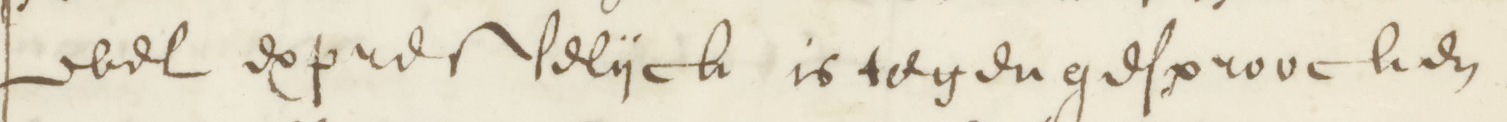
wel expresselijck is tegengesproocken
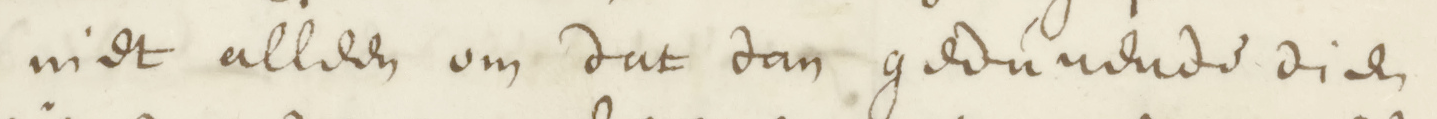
niet alleen om dat dan gedurende dien
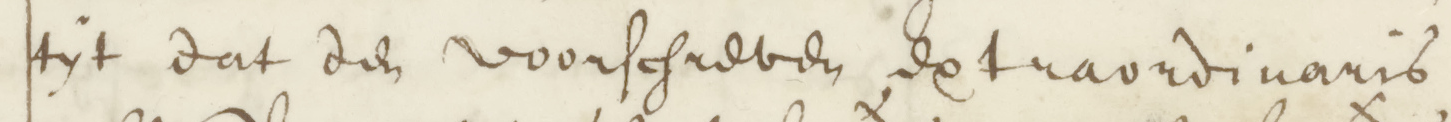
tijt dat den voorschreven extraordinaris
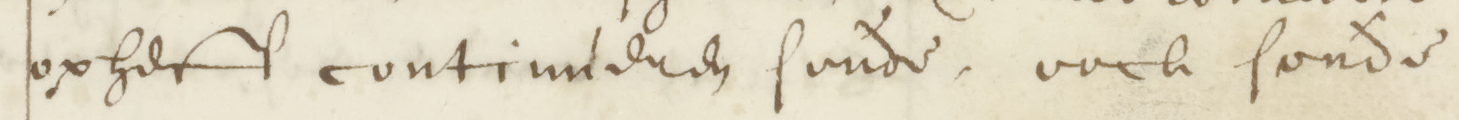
opheff continueren soude, oock soude
